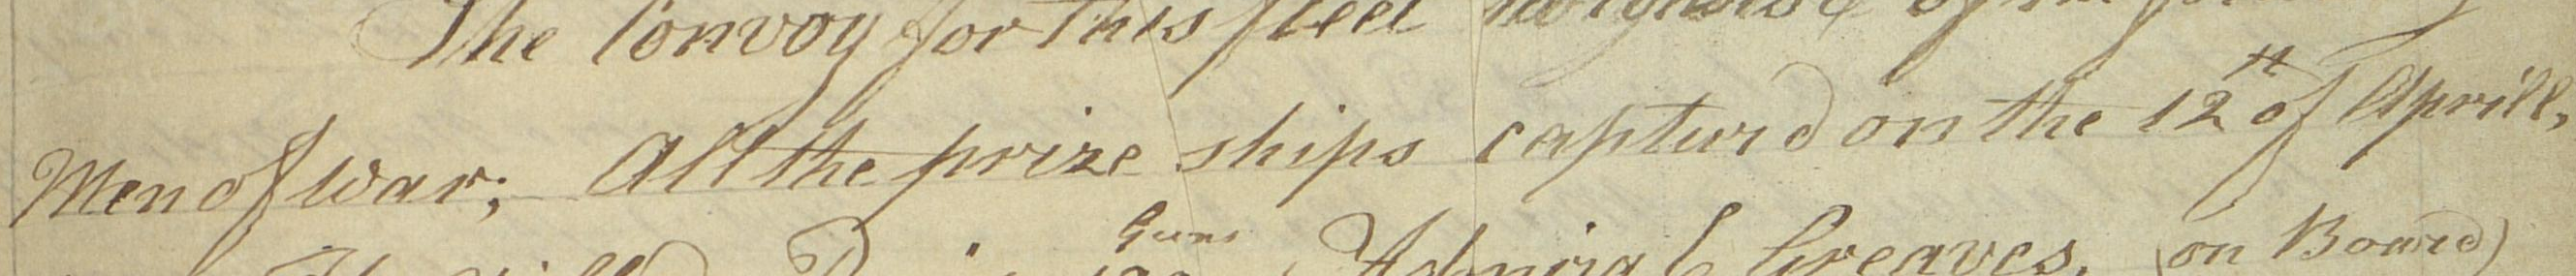Men of war, All the prize ships capturd on the 12^th of Aprill,
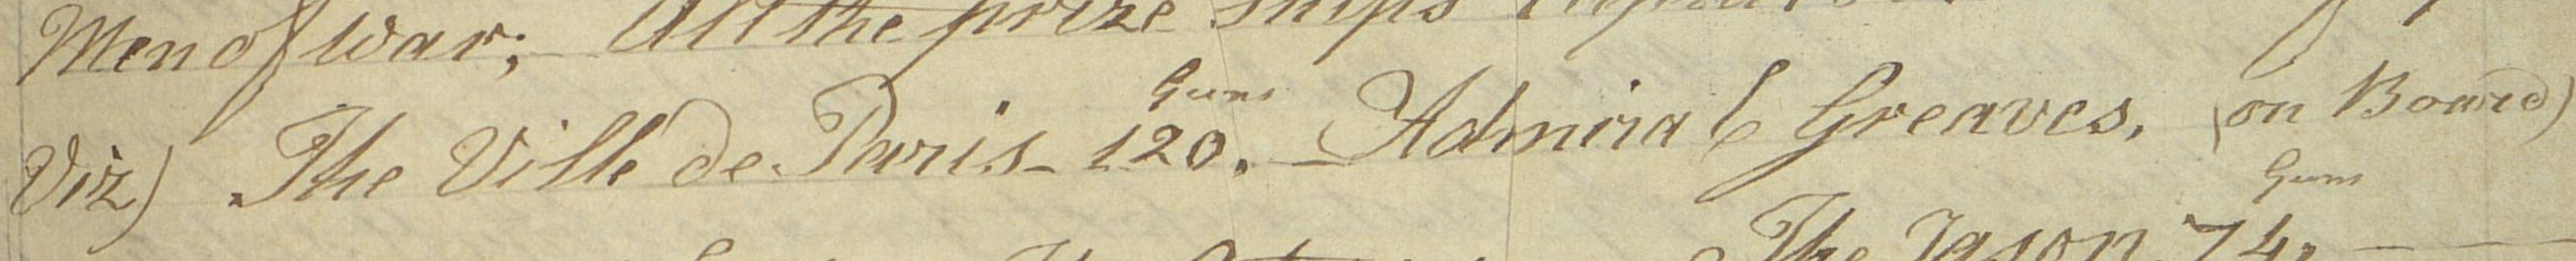Viz) The Ville de Paris 120^Guns. Admiral Greaves (on Board)
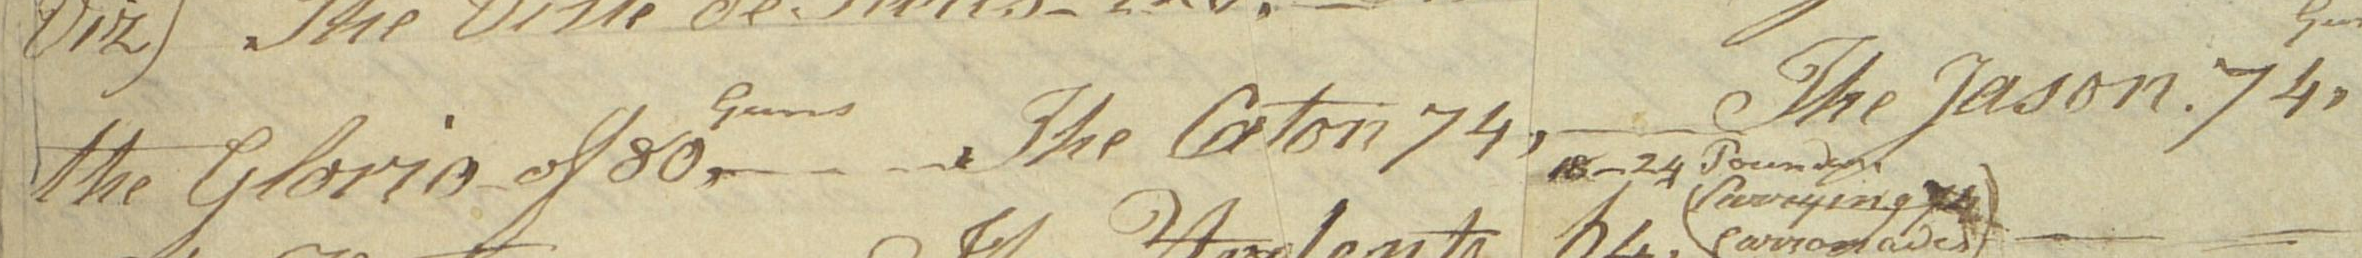the Gloria of 80^Guns The Caton 74, The Jason 74^Guns,
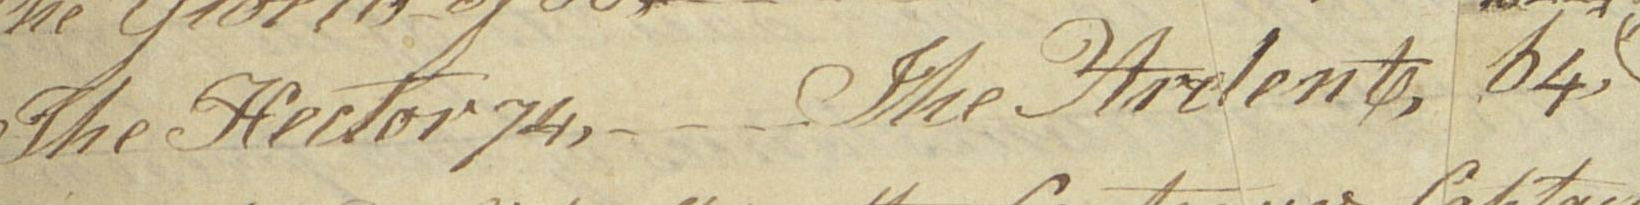The Hector 74, The Ardent, 64
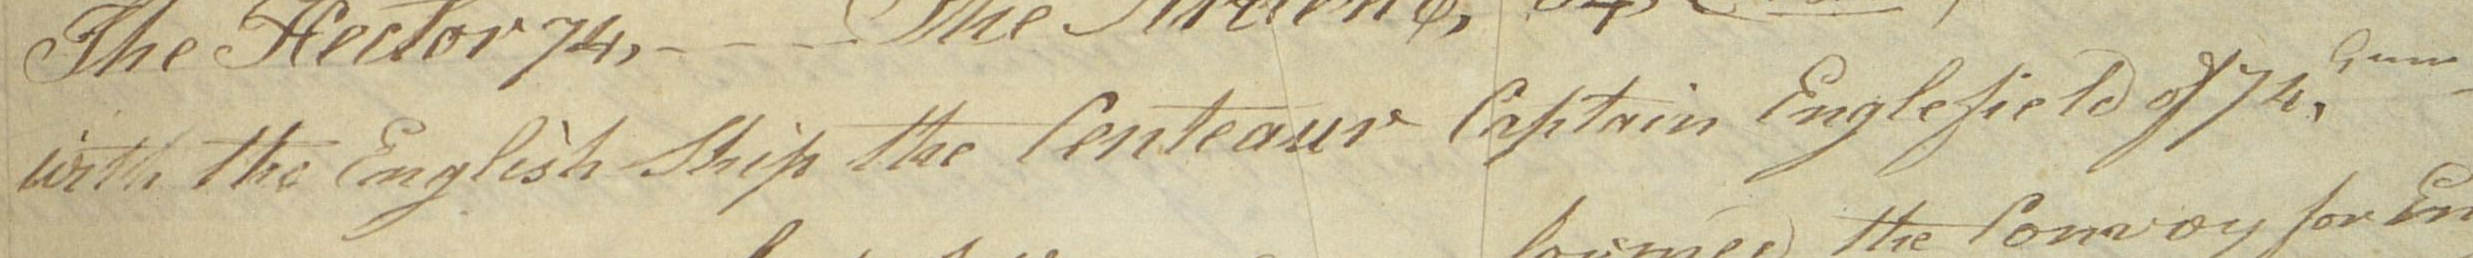with the English Ship the Centeaur Captain Engle field of 74^Guns.
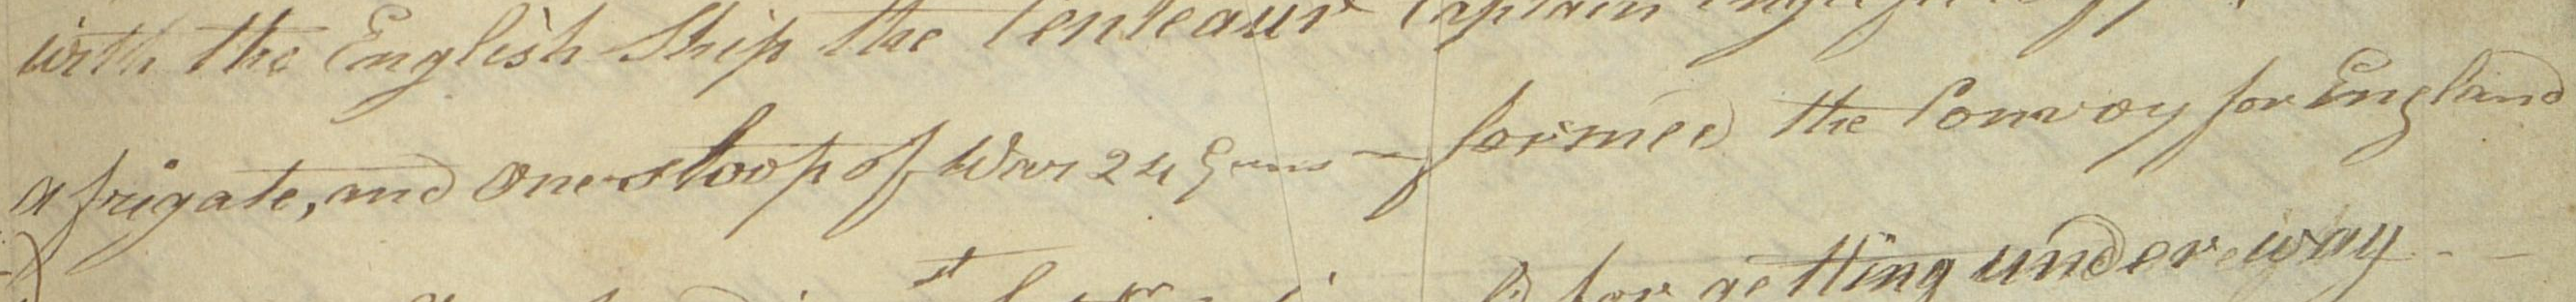a frigate, and one sloop of War 24^Guns formed the Convoy for England
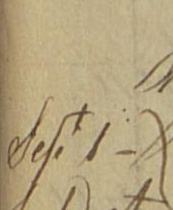Sep^t 1
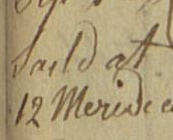Saild at
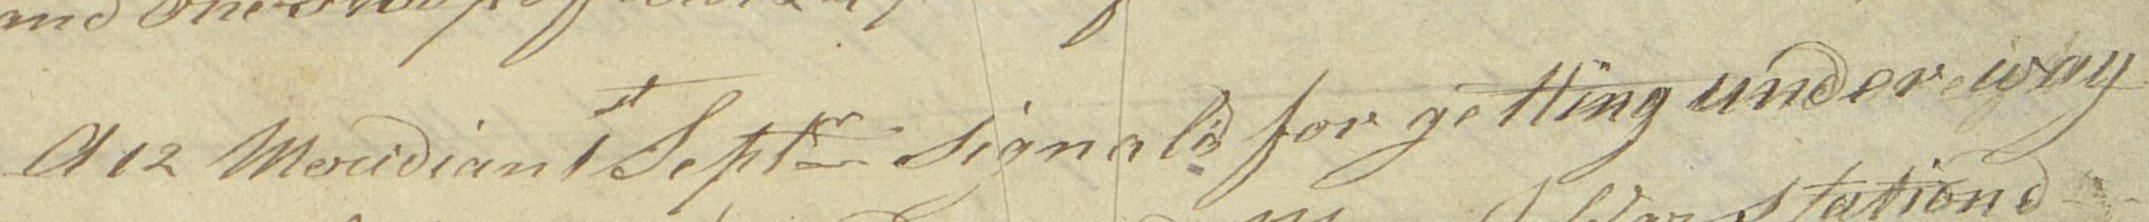A 12 Meridian 1^st Sept^r Signal'd for getting under way
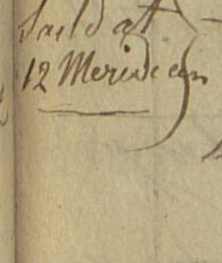12 Meridian
